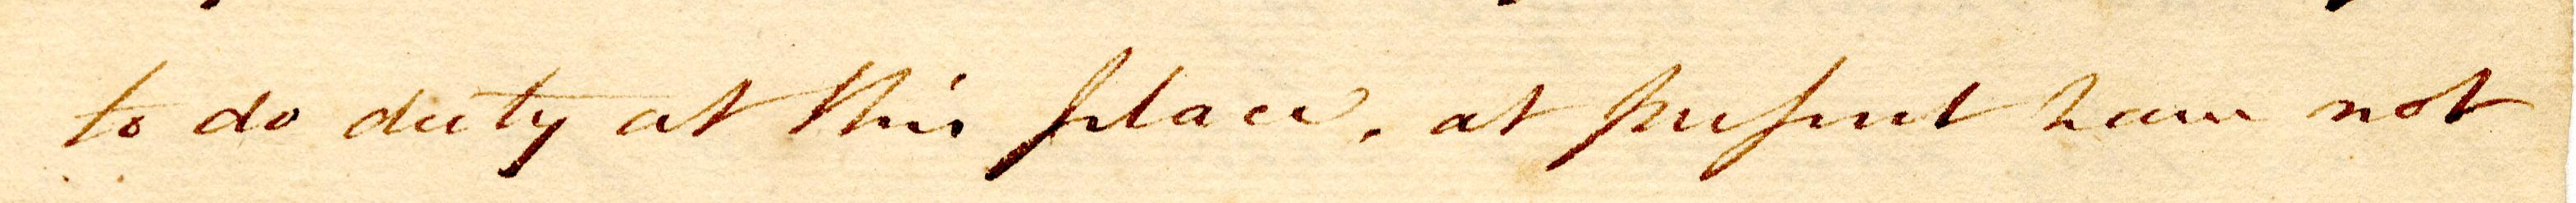to do duty at this place, at present have not
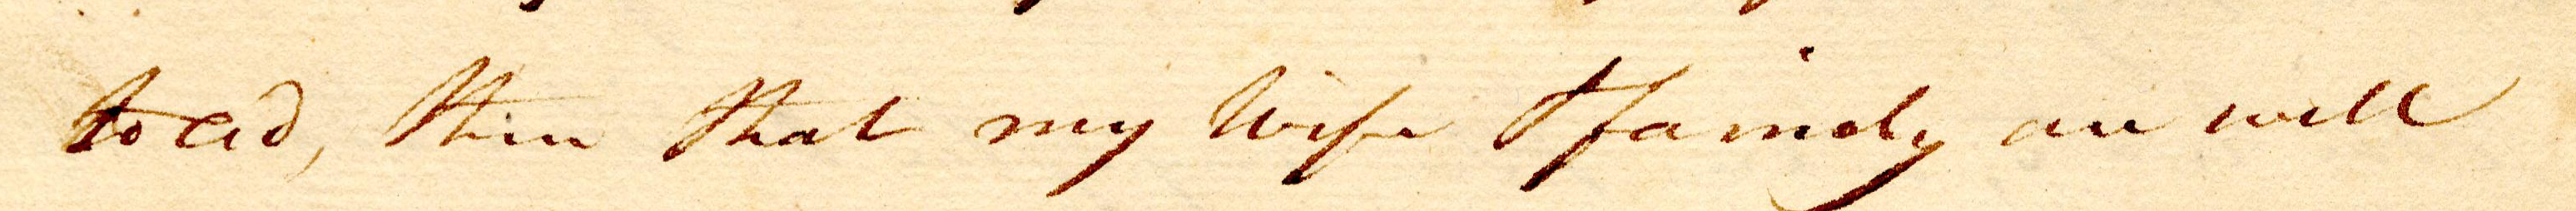to ad, this that my Wife & family are well
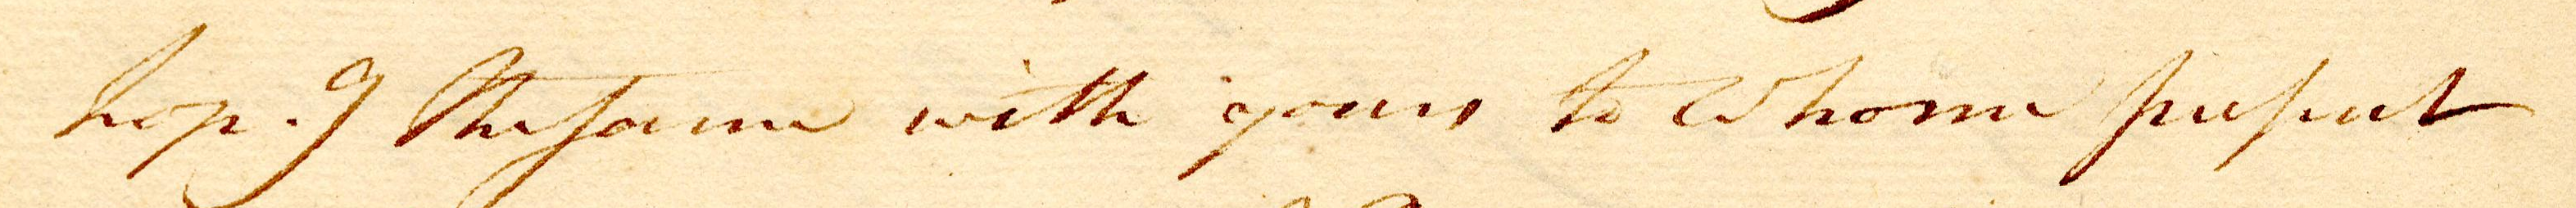hop.g the same with yours to whom present
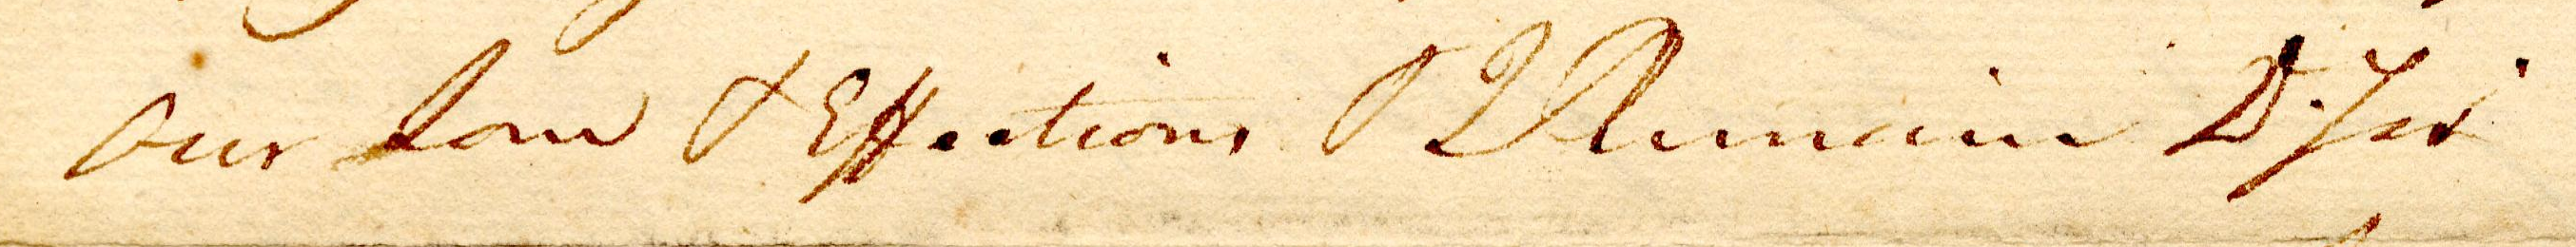our love & Effections & Remain D^r Sir
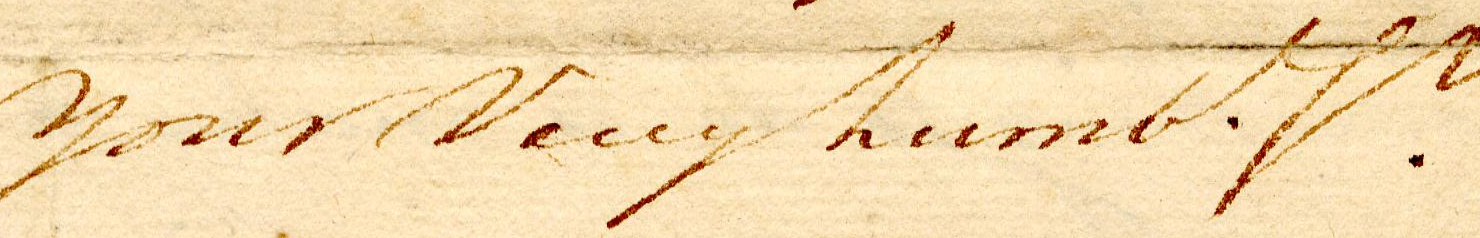your Verey humb^l S^t.
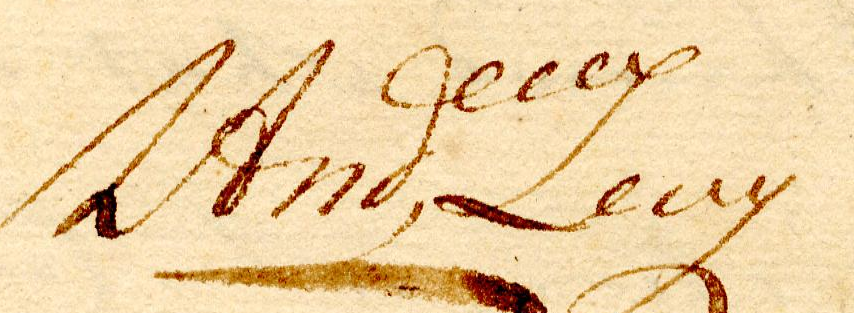And^rew Levy
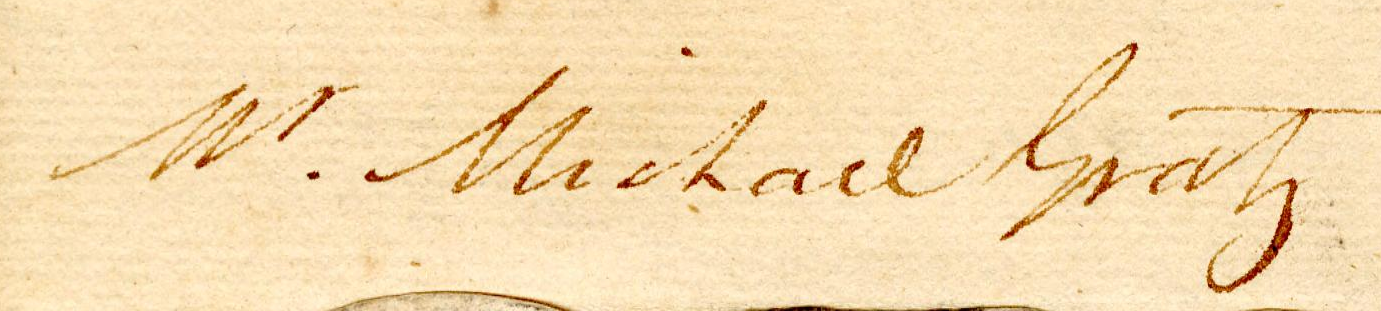M^r. Michael Gratz
